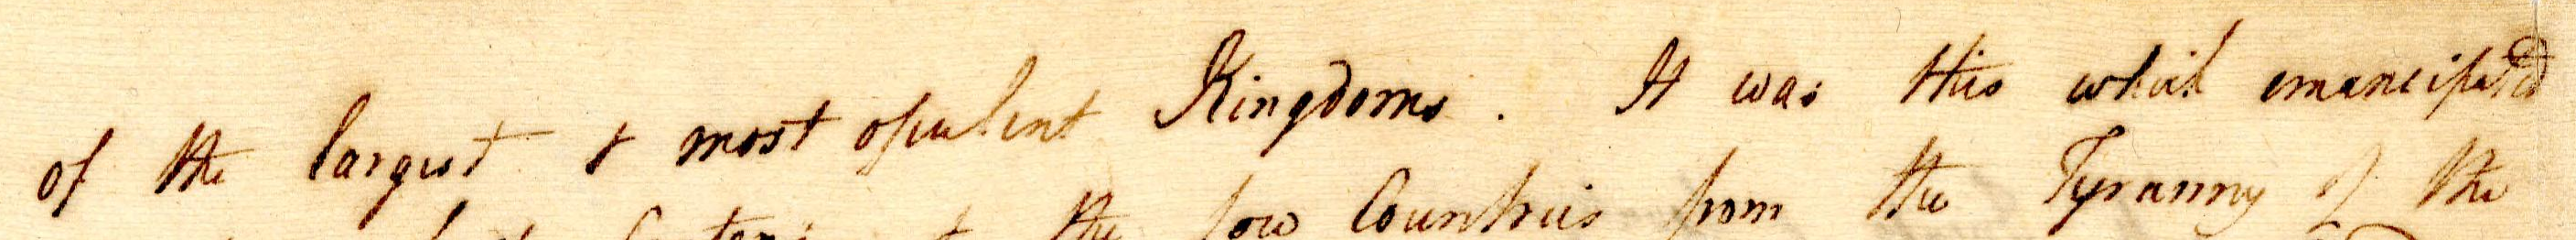of the largest & most opulent Kingdoms. It was this which manifested
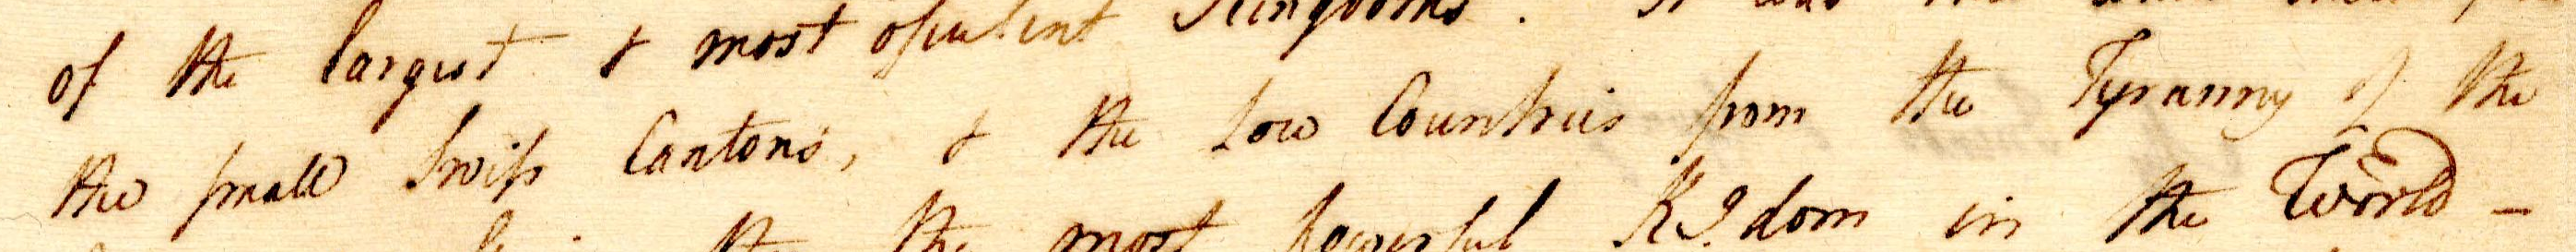the small Swiss Cantons, & the Low Countries from the Tyranny of the
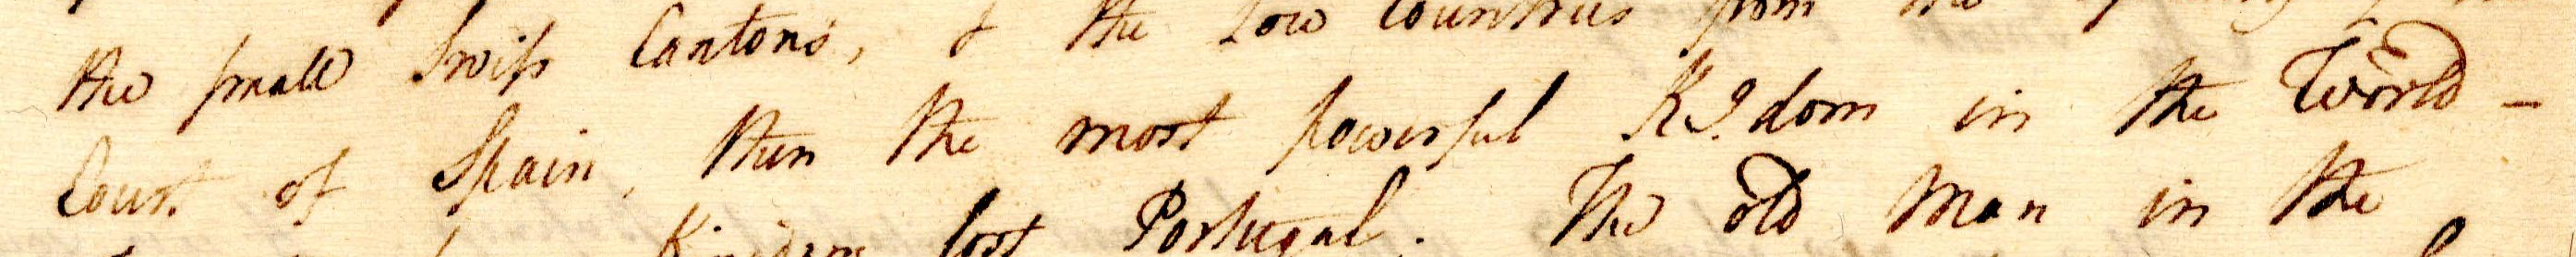Court of Spain then the most powerful K^g.dom in the World
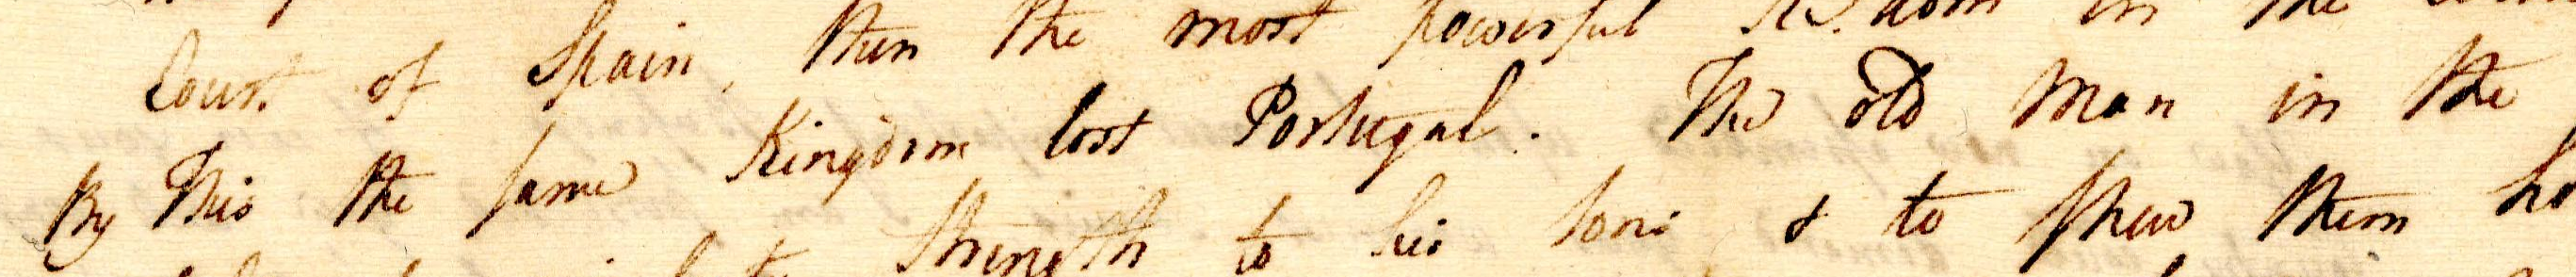By This the same Kingdom lost Portugal. The old man in the
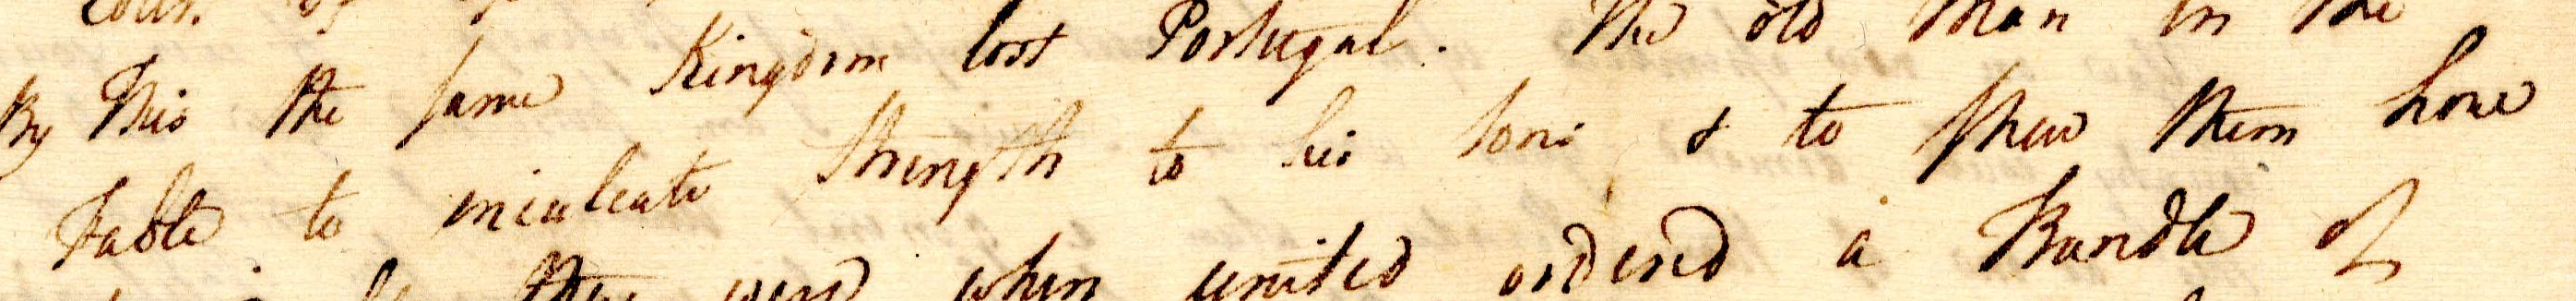fable to inculcate Strength to his Sons & to shew them how
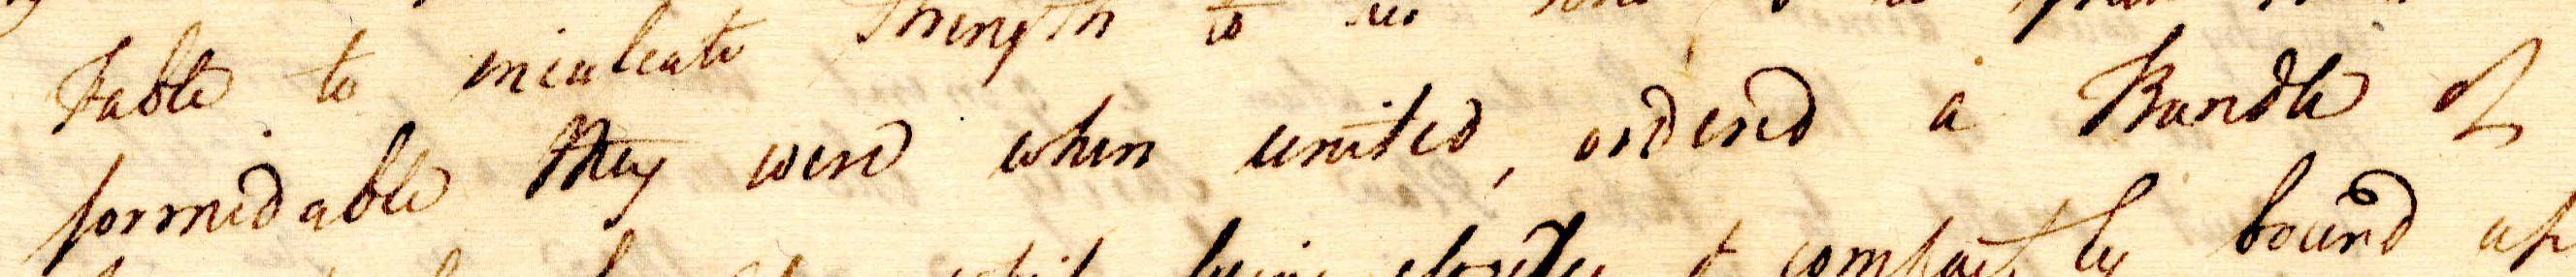formidable they were when united, ordered a Bundle of
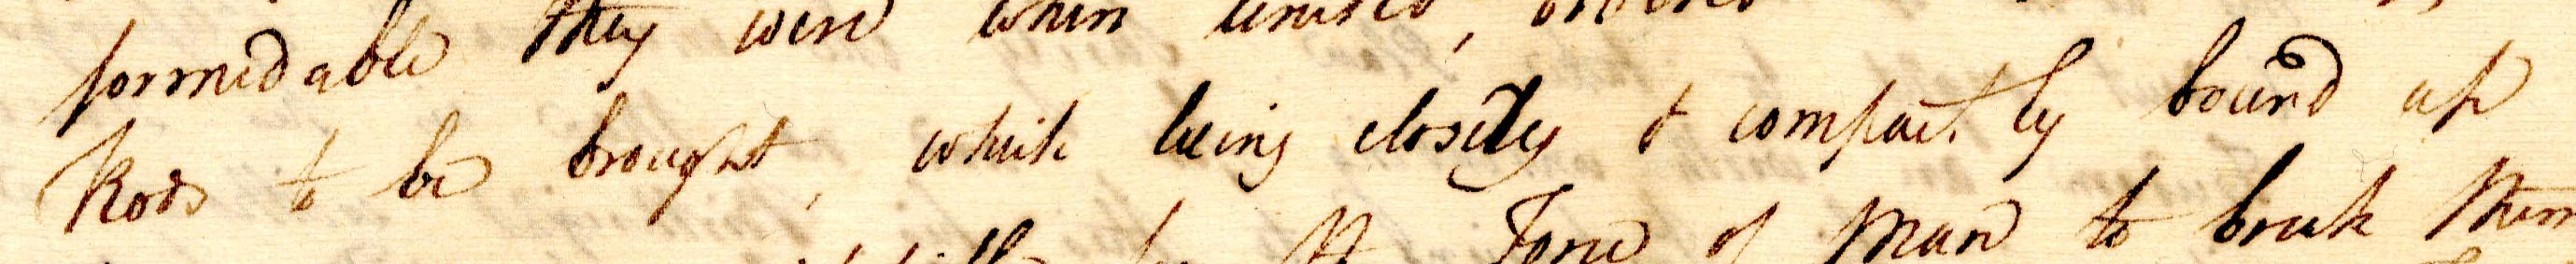Rods & be brought which being close & compactly bound up
